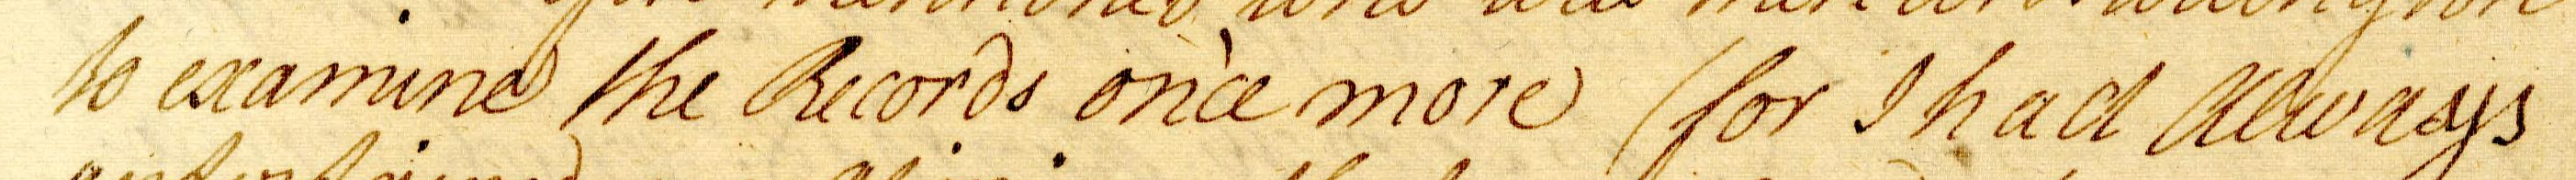to examine the Records once more (for I had Always
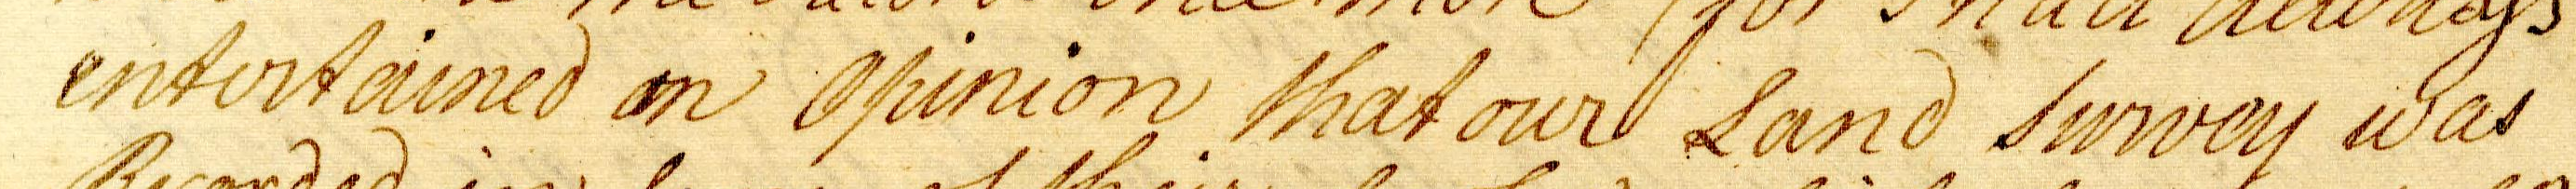entertained on Opinion that our Land Survey was
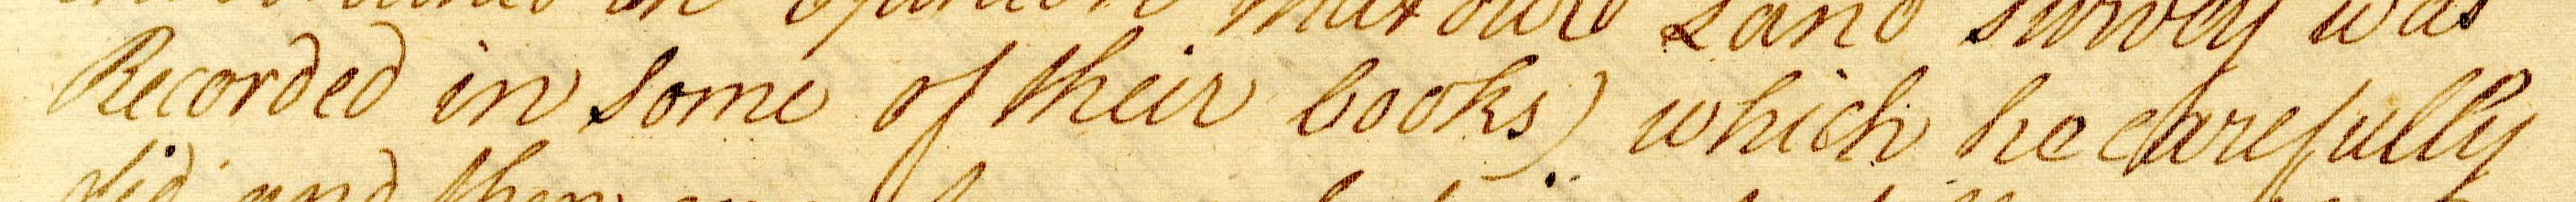Recorded in Some of their books) which he carefully
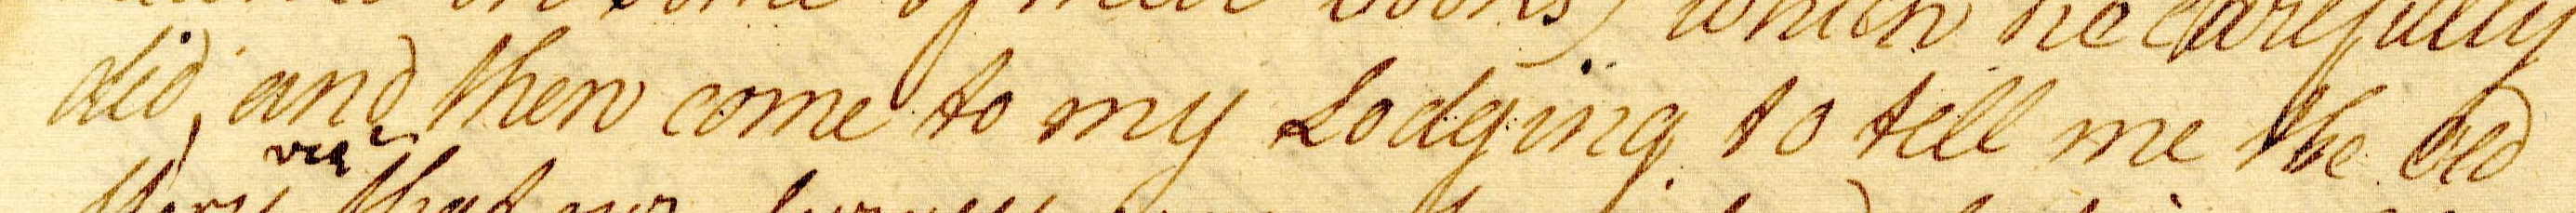did, and then come to my Lodging to tell me the Old
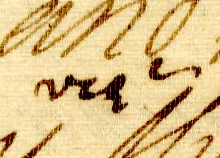viz^t
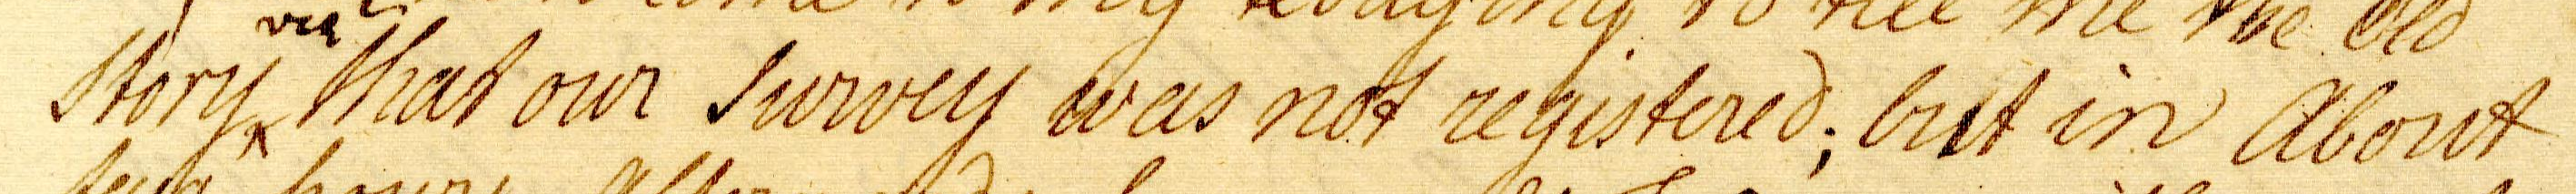story^ that our Survey was not registered; but in About
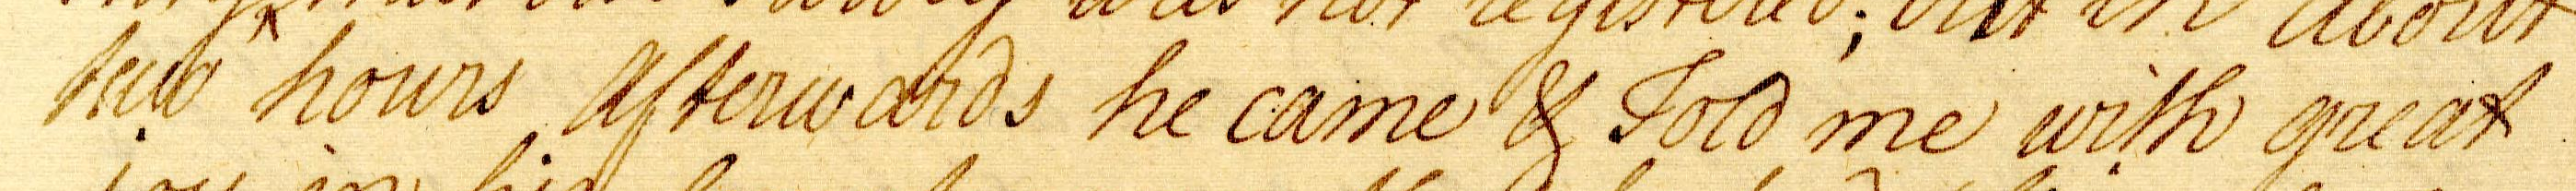five hours afterwards he came & Told me with great
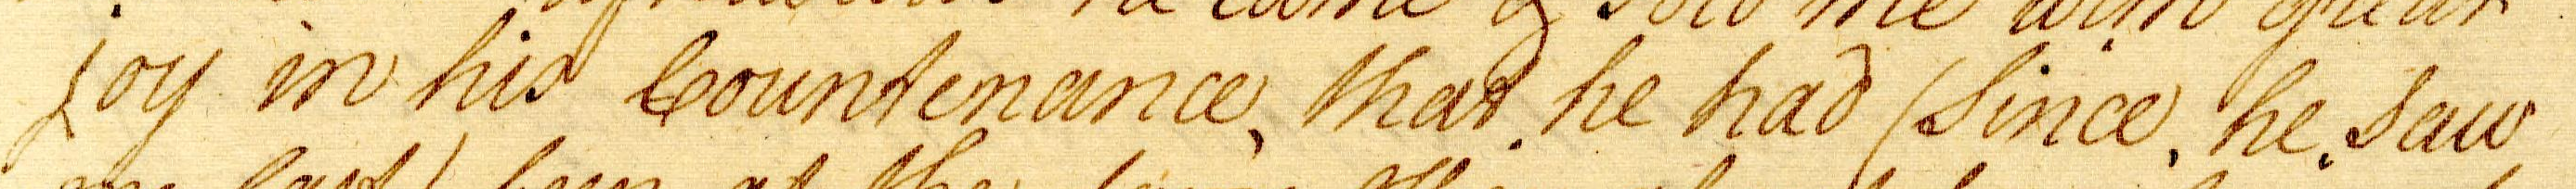joy in his Countenance, that he had (Since, he, Saw
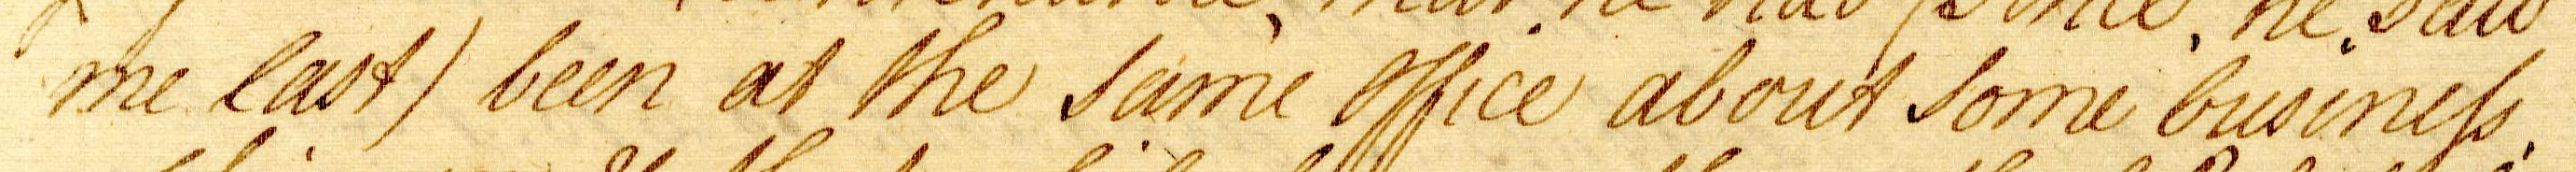me last) been at the Same Office about some business,
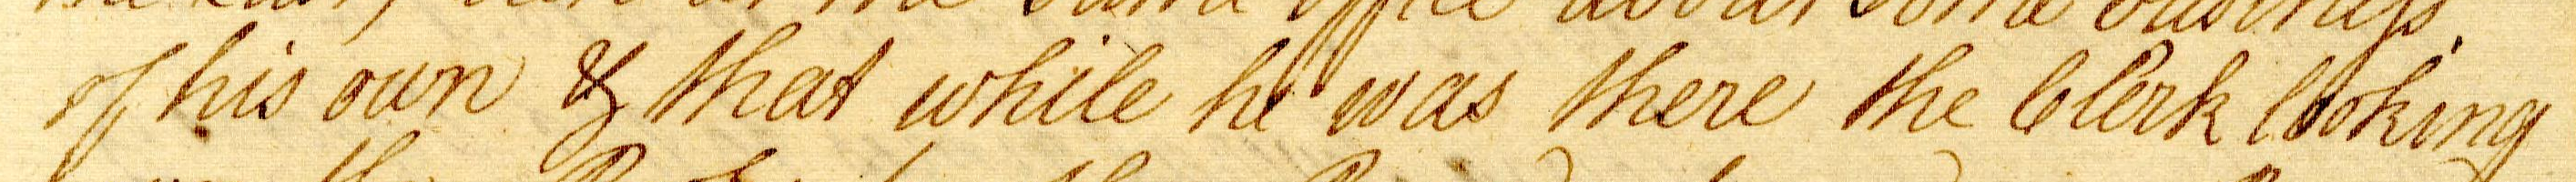of his own & that while he was there the Clerk looking
